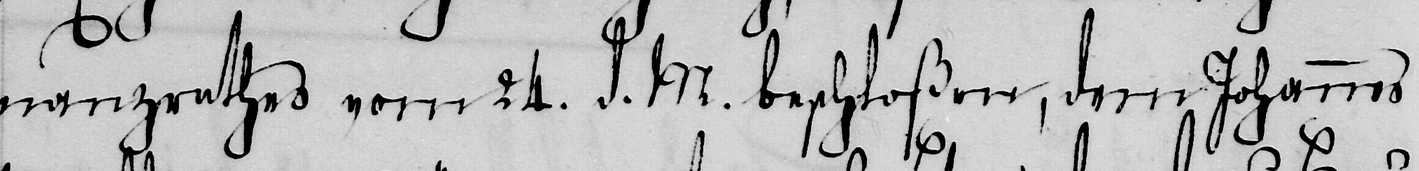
nanzrathes vom 24. d. M. beschloßen, dem Johannes
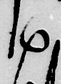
11.
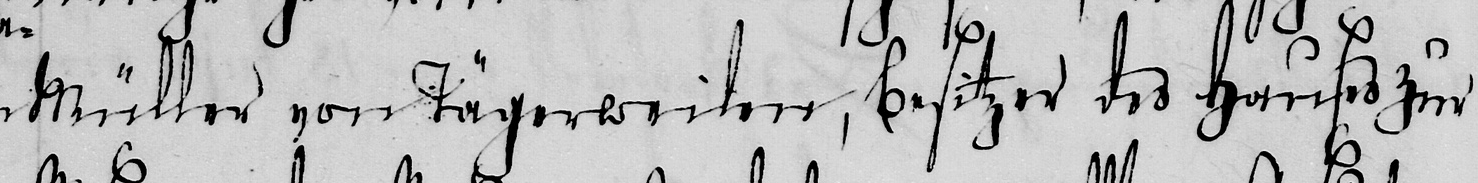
Müller von Tägerweilen, Besitzer des Hauses zur
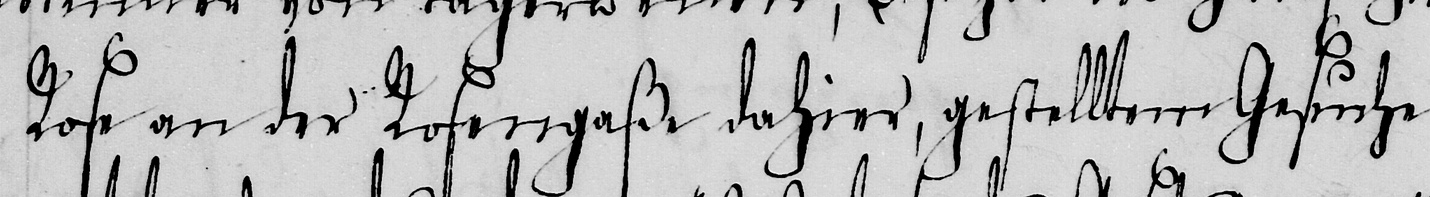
Rose an der Rosengaße dahier, gestelltem Gesuche
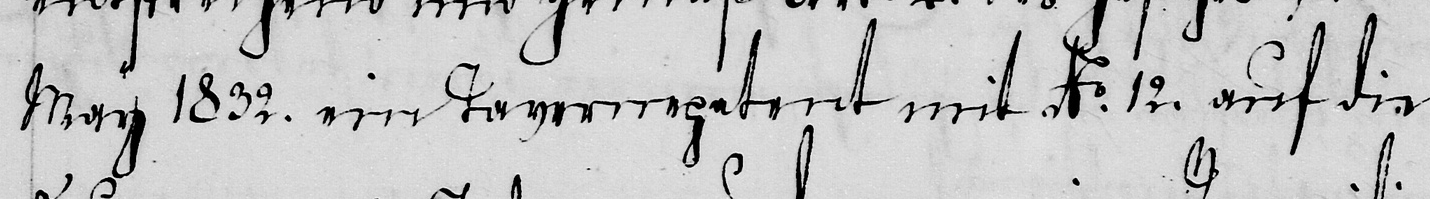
May 1832. ein Tavernepatent mit No. 12. auf die
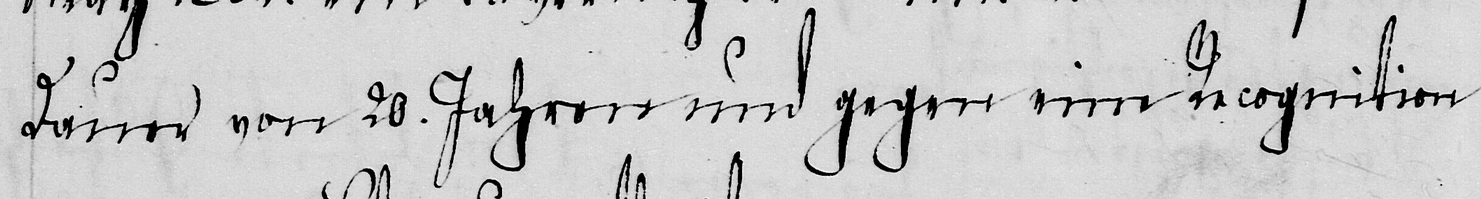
Dauer von 20. Jahren und gegen eine Recognition
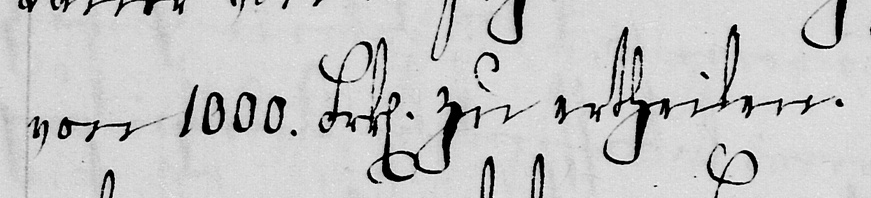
von 1000. Frk[en]. zu ertheilen.
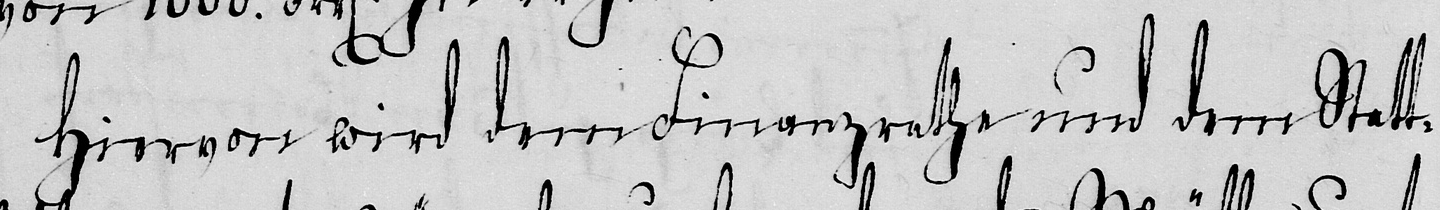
Hiervon wird dem Finanzrathe und dem Stat¬
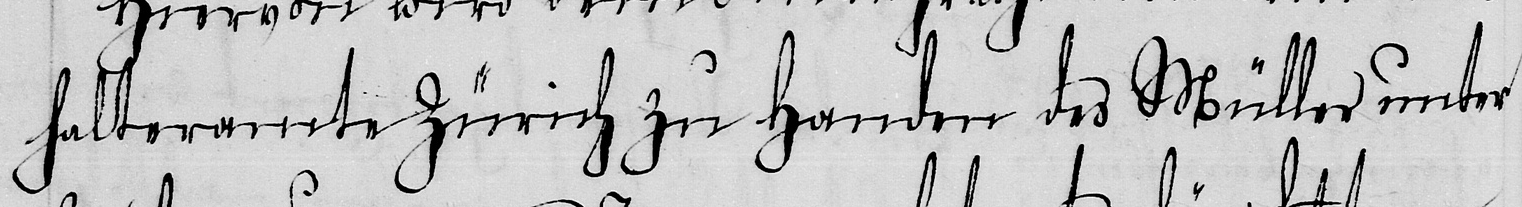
thalteramte Zürich zu Handen des Müller unter
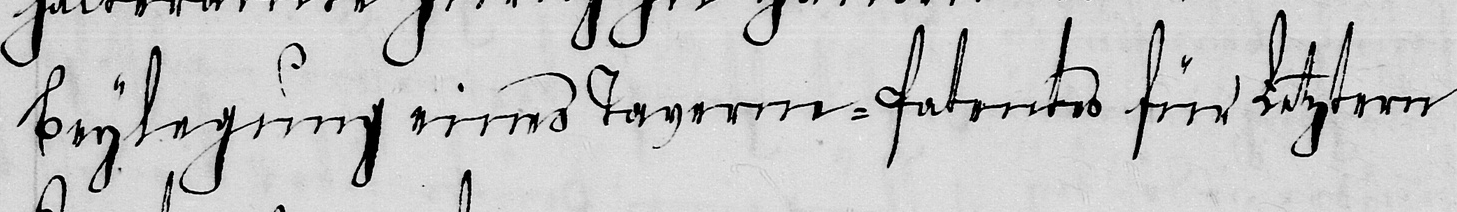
Beylegung eines Taverne-Patentes für Letztern
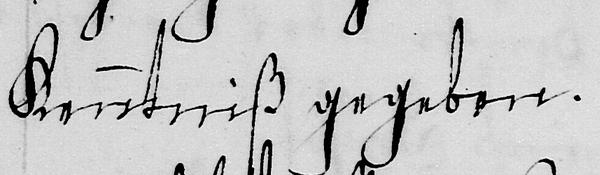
Kenntniß gegeben.
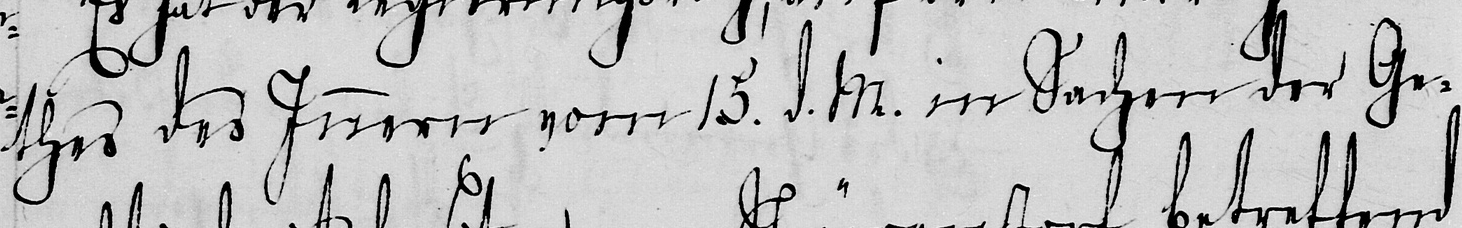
thes des Innern vom 15. d. M. in Sachen der Ger¬
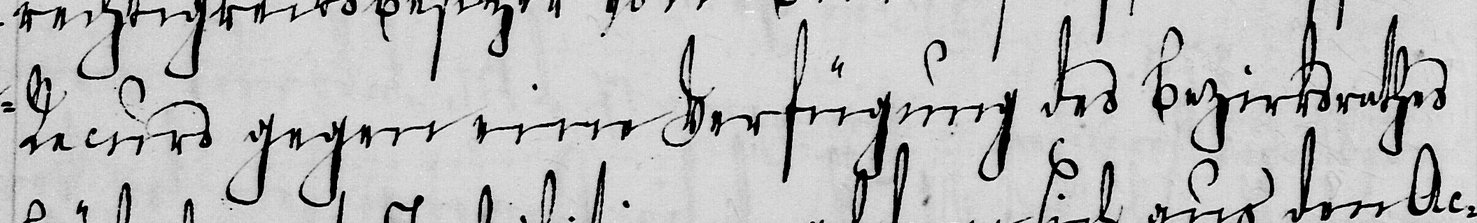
Recurs gegen eine Verfügung des Bezirksrathes
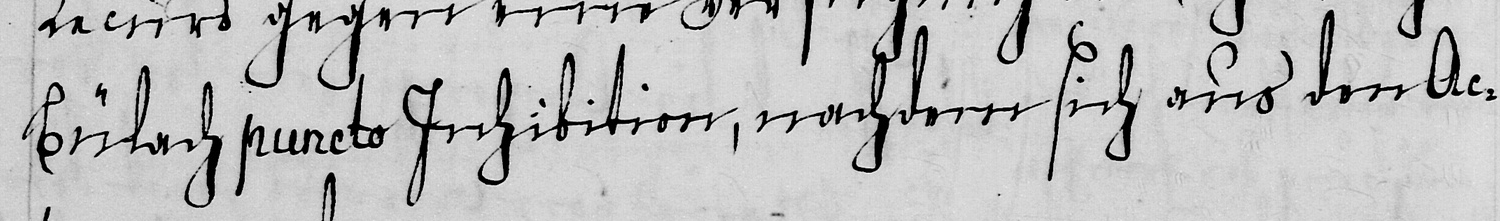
Bülach puncto Inhibition, nachdem sich aus den Ac¬
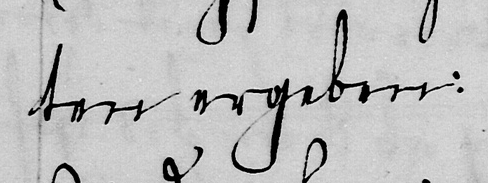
ten ergeben:
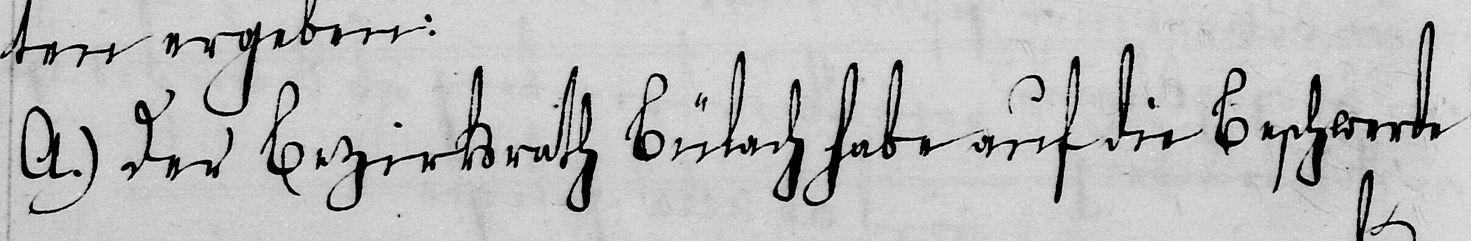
A.) Der Bezirksrath Bülach habe auf die Beschwerde
